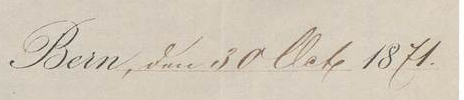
, den 30 Oct. 1871
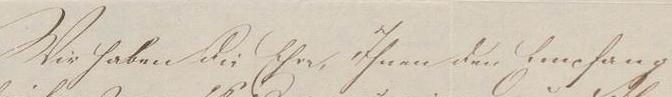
Wie haben die Ehre, Ihnen den Empfang
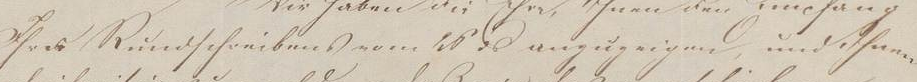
Ihres Rundschreibens vom 16ds anzuzeigen, und Ihnen
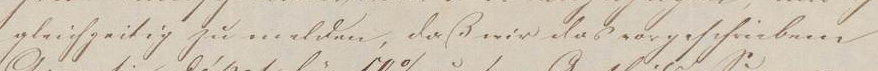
gleichzeitig zu melden, daß wir das vorgeschriebene
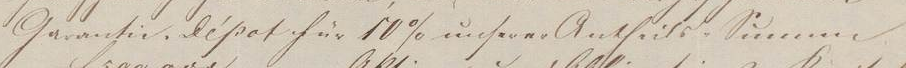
Garantie-Dépot für 10% unserer Antheils-Summe
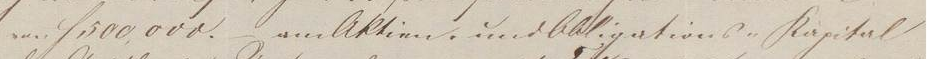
von f 500,000.– am Aktien- und Obligations-Kapital
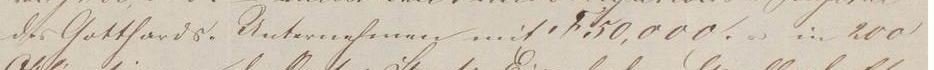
des Gotthards-Unternehmen mit F 50,000.– in 200
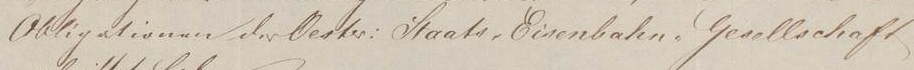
Obligationen der Oester: Staats-Eisenbahn-Gesellschaft
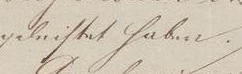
geleistet haben.
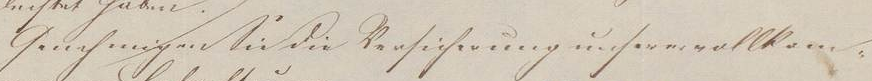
Genehmigen Sie die Versicherung unserer vollkom-
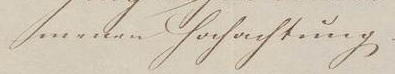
menen Hochachtung.
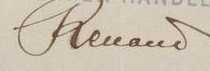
Renaud
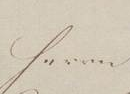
Herrn
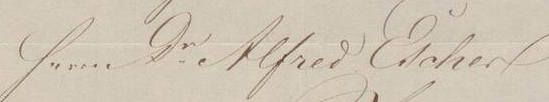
Herrn Dr Alfred Escher
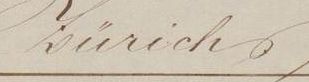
Zürich.
